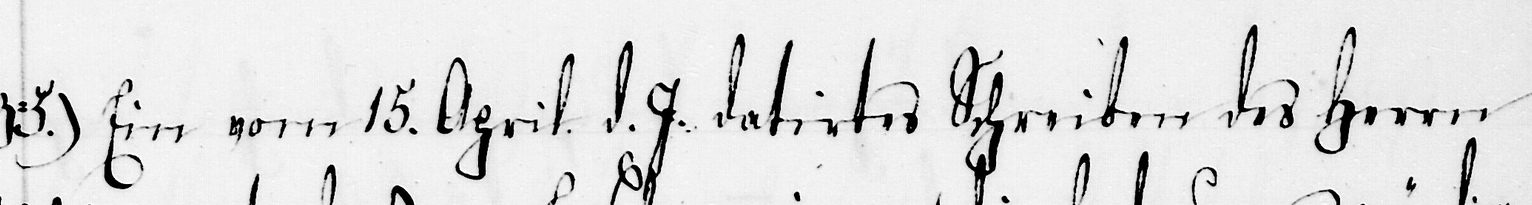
5.) Ein vom 15. April d. J. datirtes Schreiben des Herrn
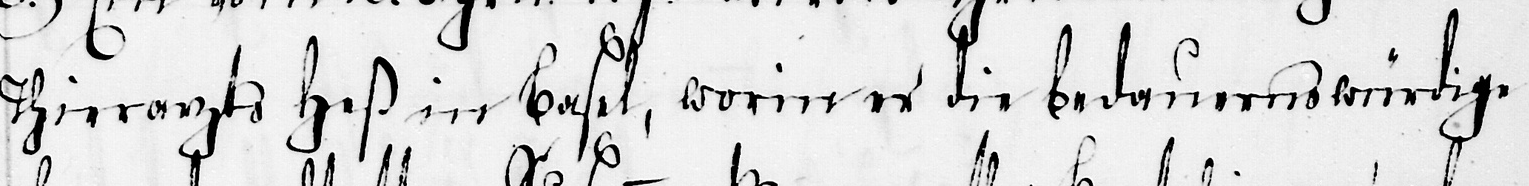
Thierarzts Heß in Basel, worin er die bedauernswürdige
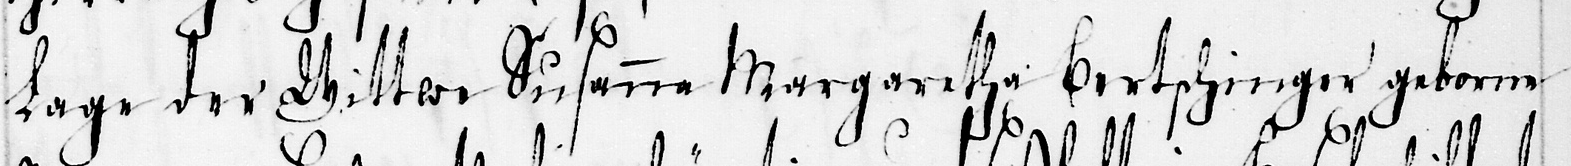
Lage der Wittwe Susanna Margaretha Bertschinger geborne
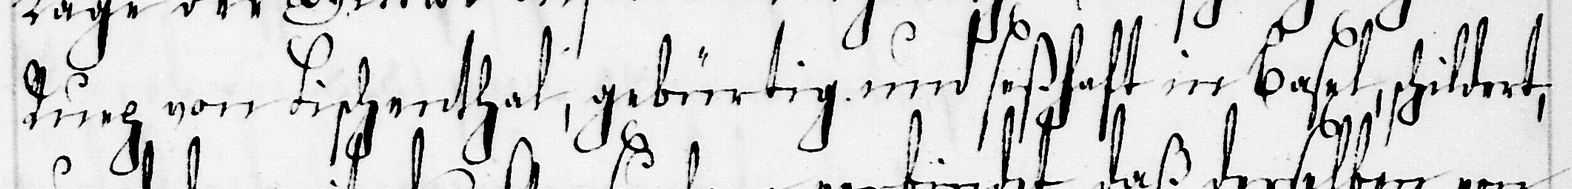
Ruep von Fischenthal, gebürtig und seßhaft in Basel, schild¬
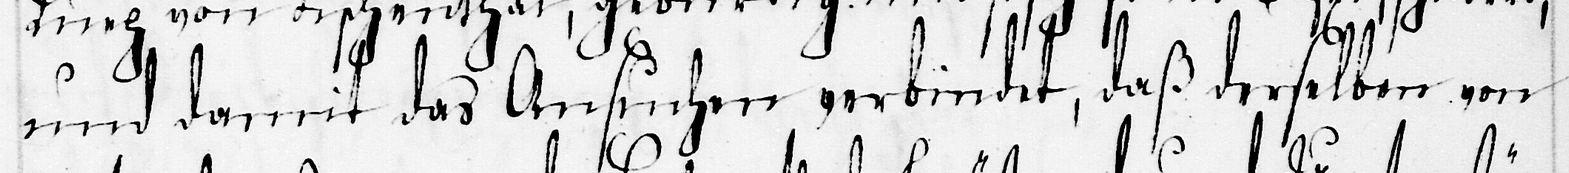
und damit das Ansuchen verbindet, daß derselben von
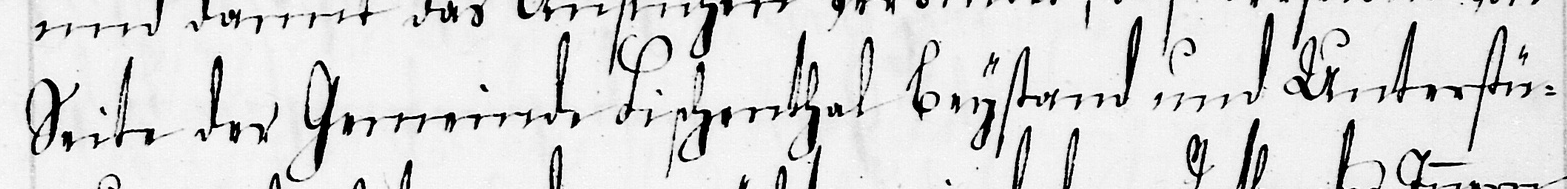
Seite der Gemeinde Fischenthal Beystand und Unterstü¬
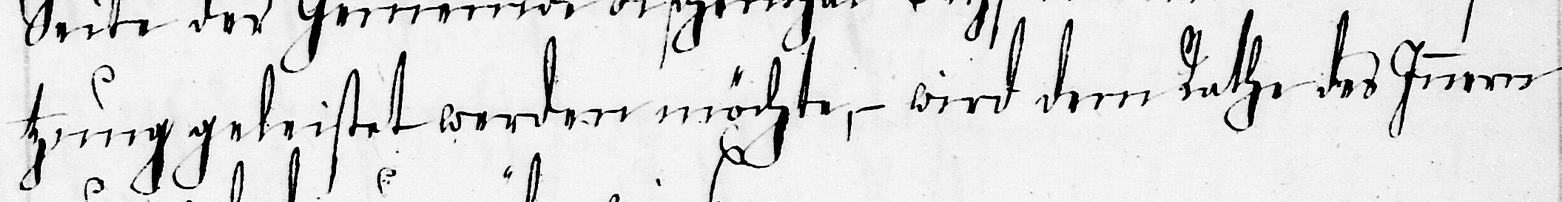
tzung geleistet werden möchte, – wird dem Rathe des Innern
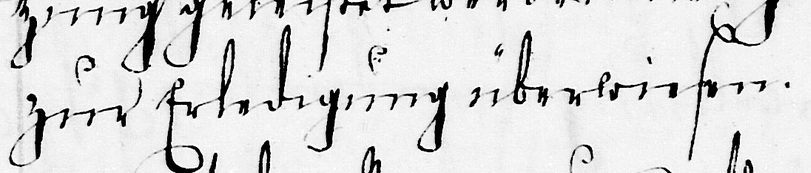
zur Erledigung überwiesen.
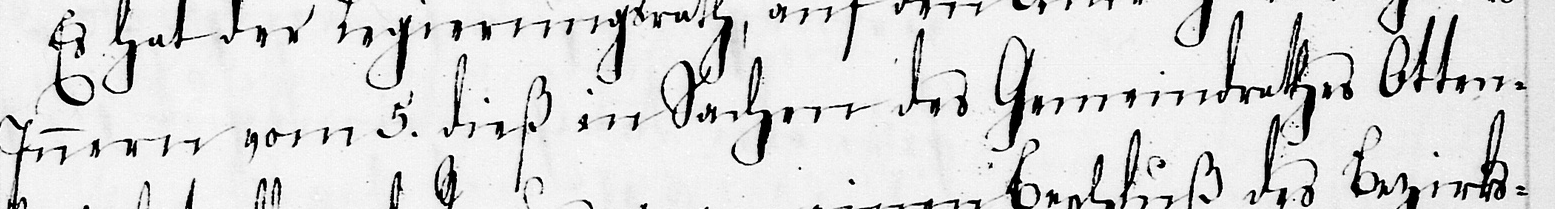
Innern vom 5. dieß in Sachen des Gemeindrathes Otten¬
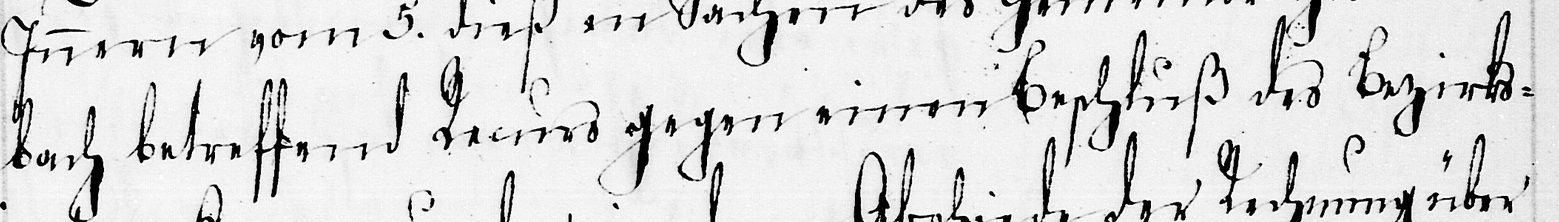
bach betreffend Recurs gegen einen Beschluß des Bezirks¬
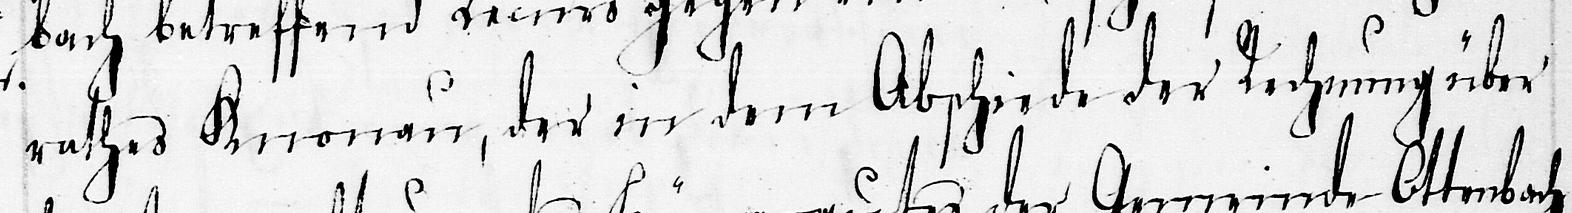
rathes Knonau, der in dem Abschiede der Rechnung über
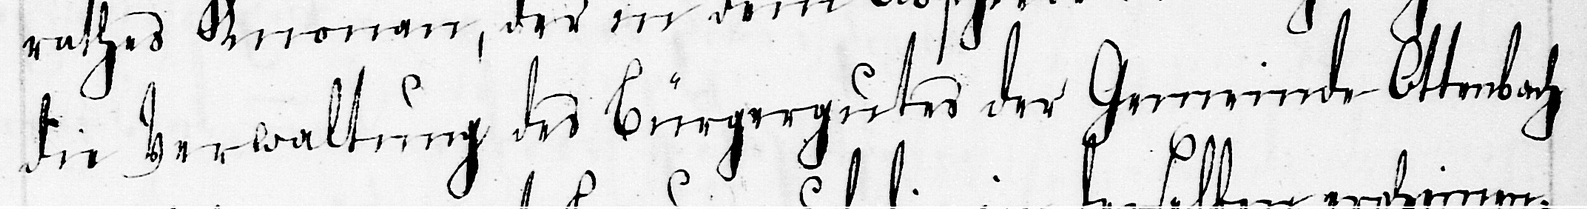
die Verwaltung des Bürgergutes der Gemeinde Ottenbach
